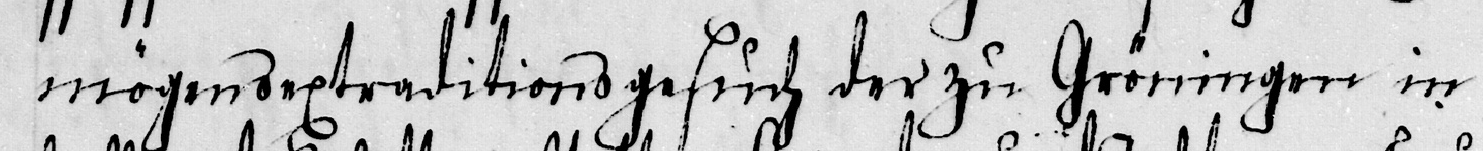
mögensextraditionsgesuch der zu Gröningen in
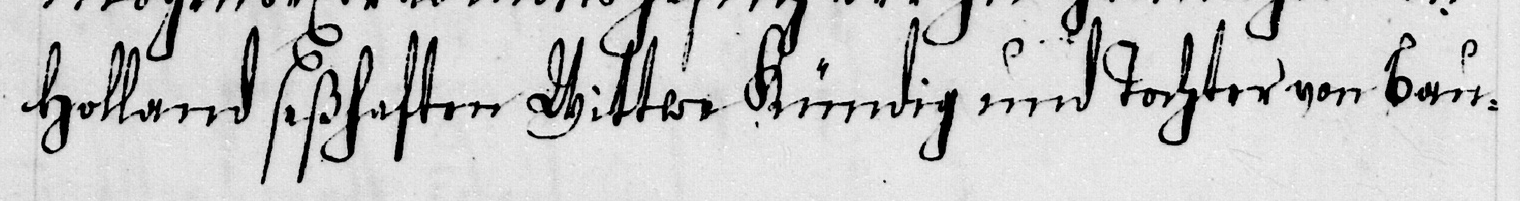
Holland seßhaften Wittwe Kündig und Tochter von Bau¬
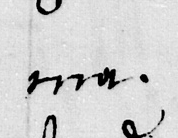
ma.
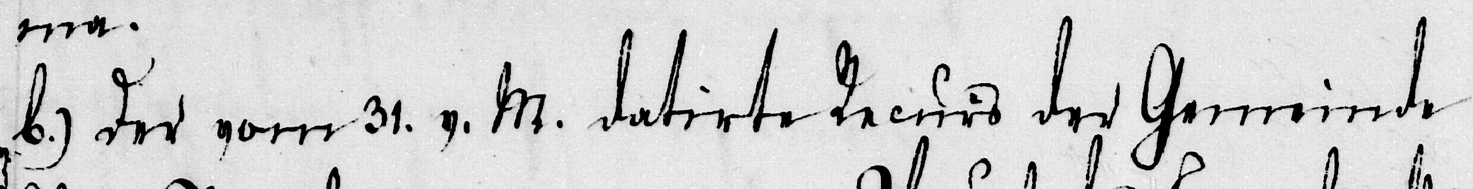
b.) Der vom 31. v. M. datirte Recurs der Gemeinde
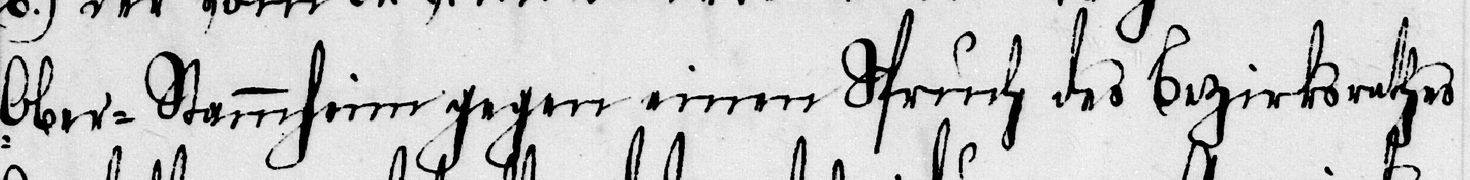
Ober-Stammheim gegen einen Spruch des Bezirksrathes
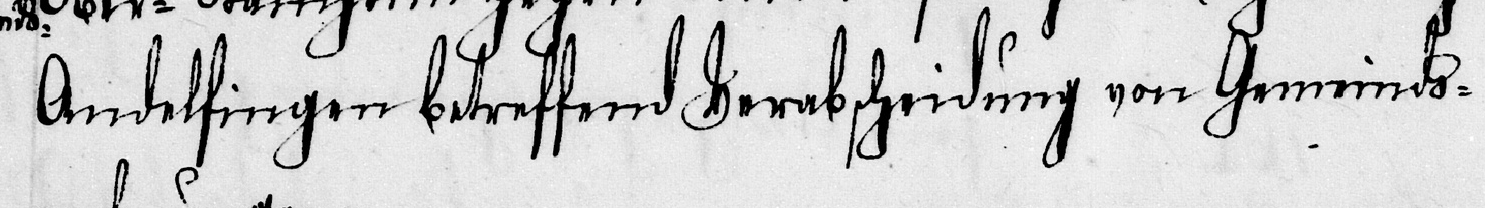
Andelfingen betreffend Verabscheidung von Gemeinds¬
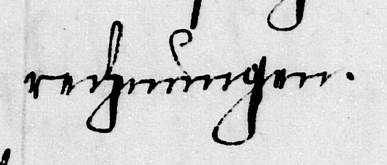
rechnungen.
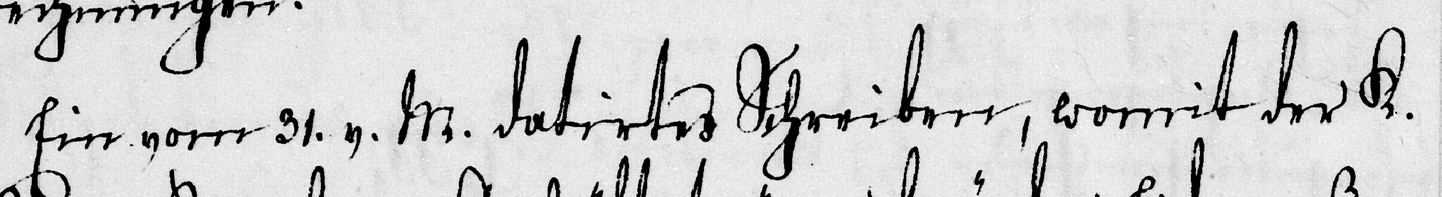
Ein vom 31. v. M. datirtes Schreiben, womit der K.
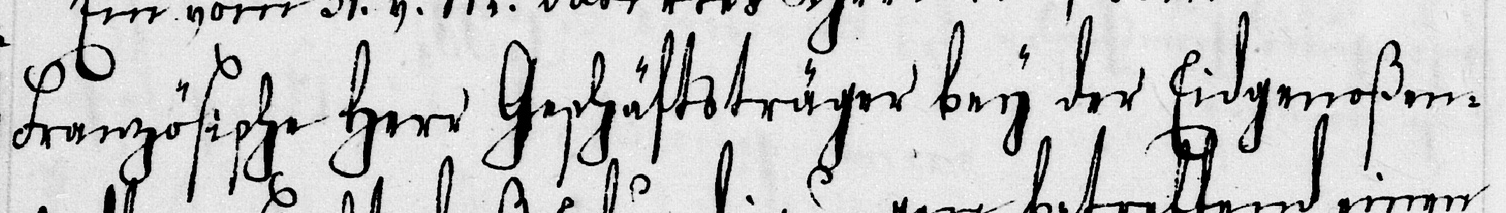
Französische Herr Geschäftsträger bey der Eidgenoßen¬
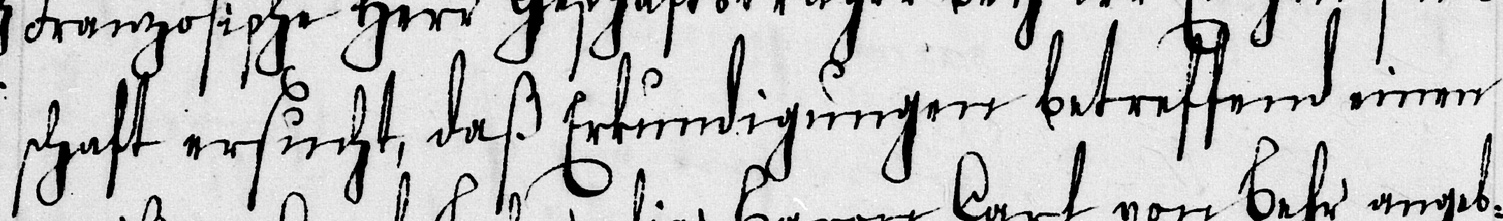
schaft ersucht, daß Erkundigungen betreffend einen
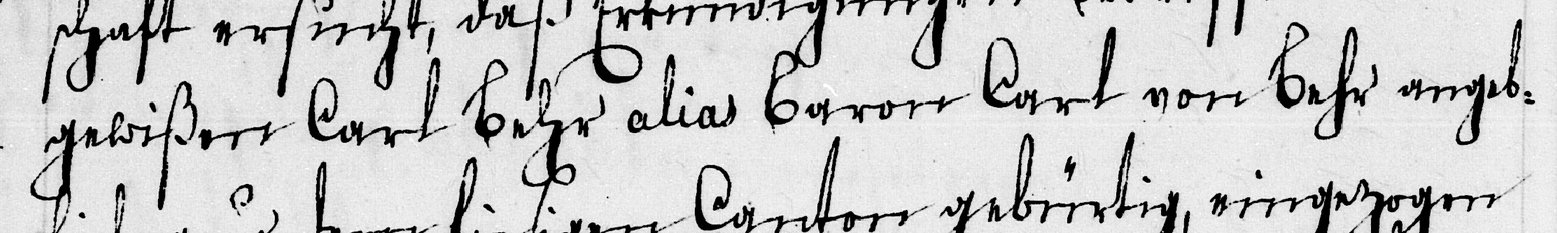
gewißen Carl Behr alias Baron Carl von Behr angeb¬
